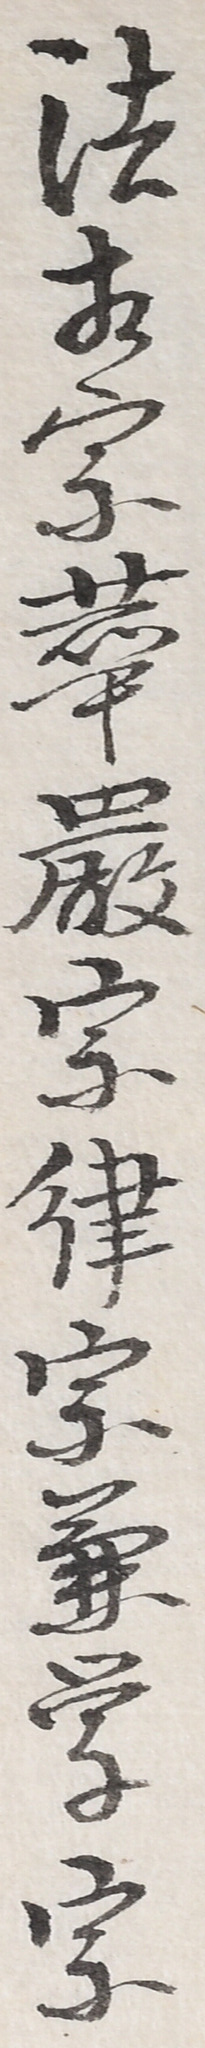法相宗華厳宗律宗兼学宗
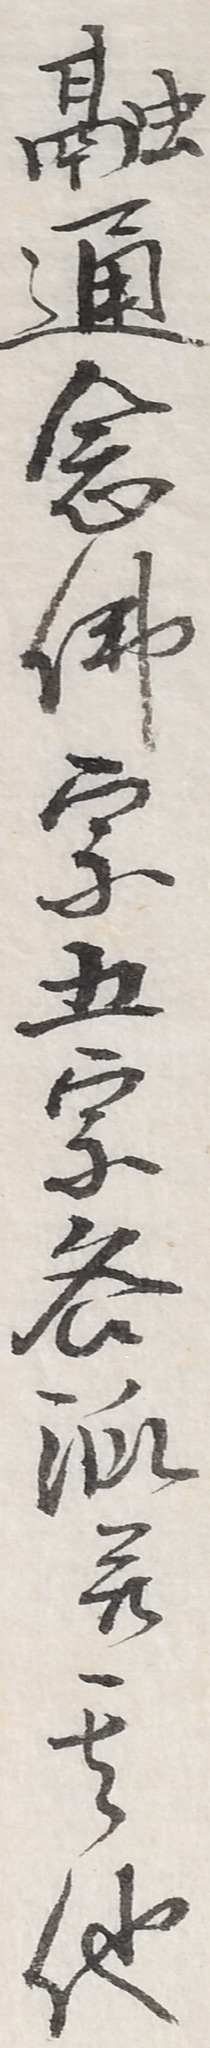融通念仏宗五宗各派幷其他
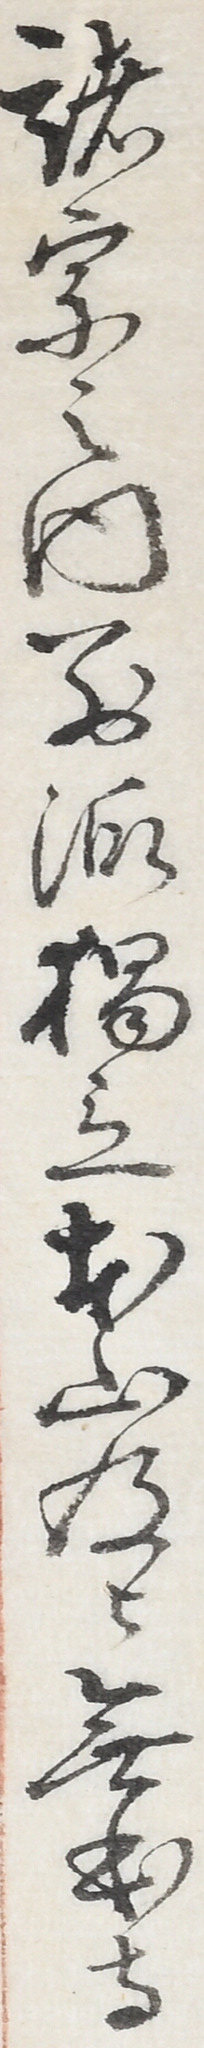諸宗之内別派独立本山及ヒ無本寺
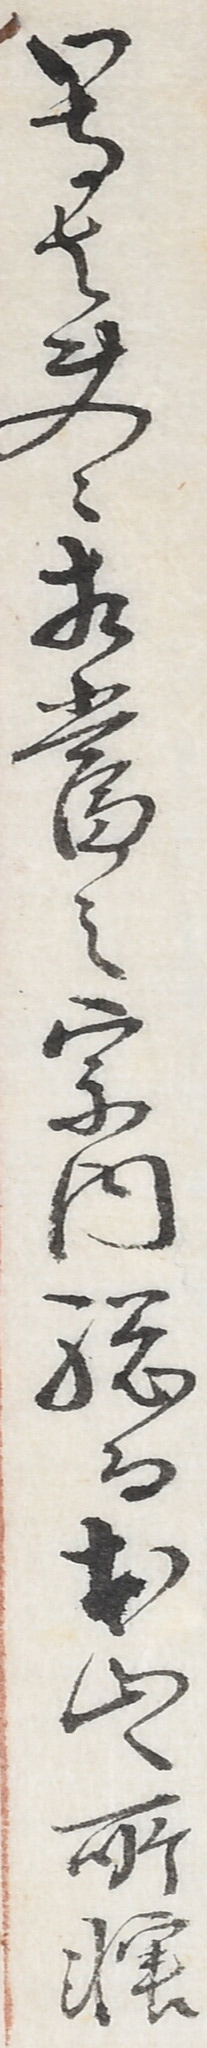等は夫々相当之宗内総而本山へ所轄
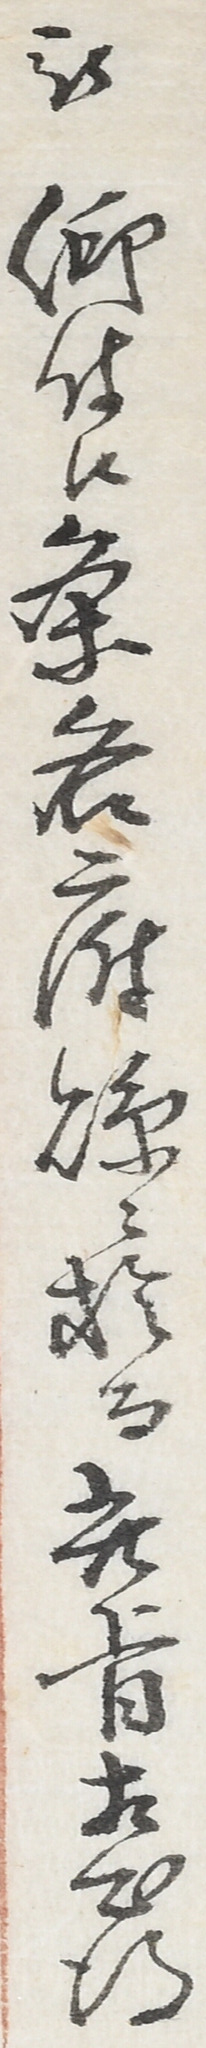被仰付候条各府県ニ於而此旨相心得
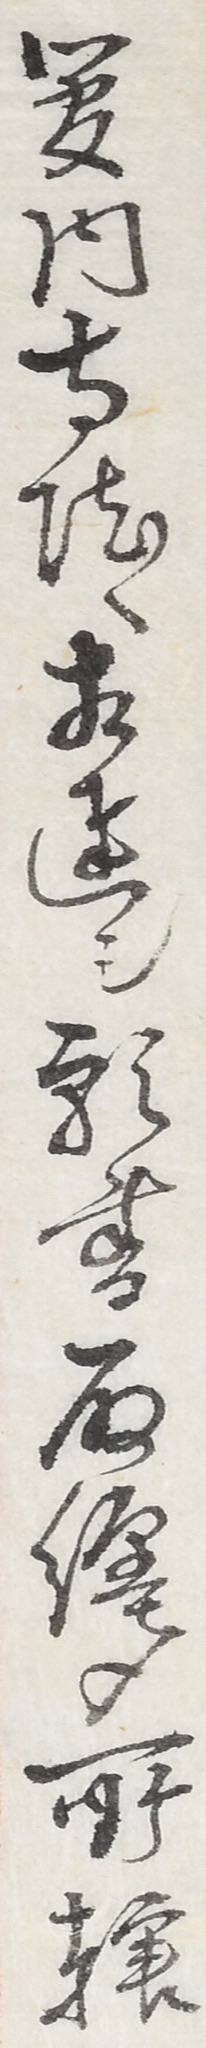管内寺院へ相達シ願書取纏メ所轄
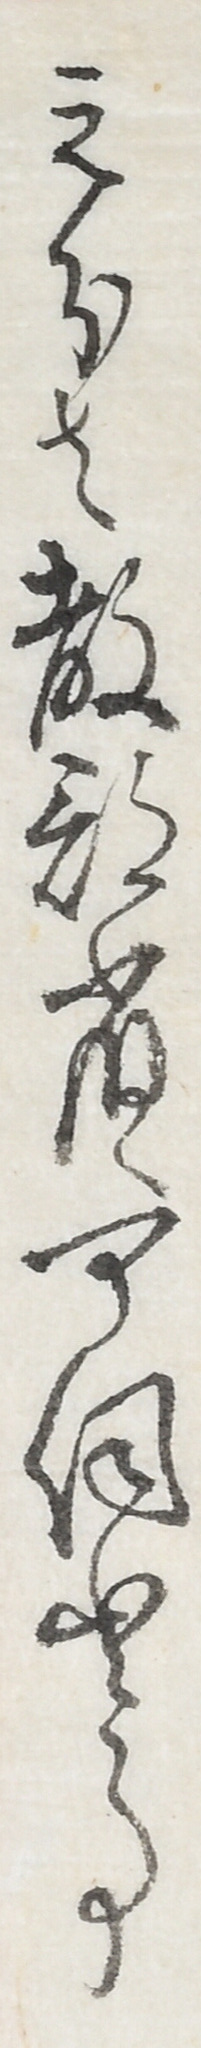之分は教部省へ可伺出事
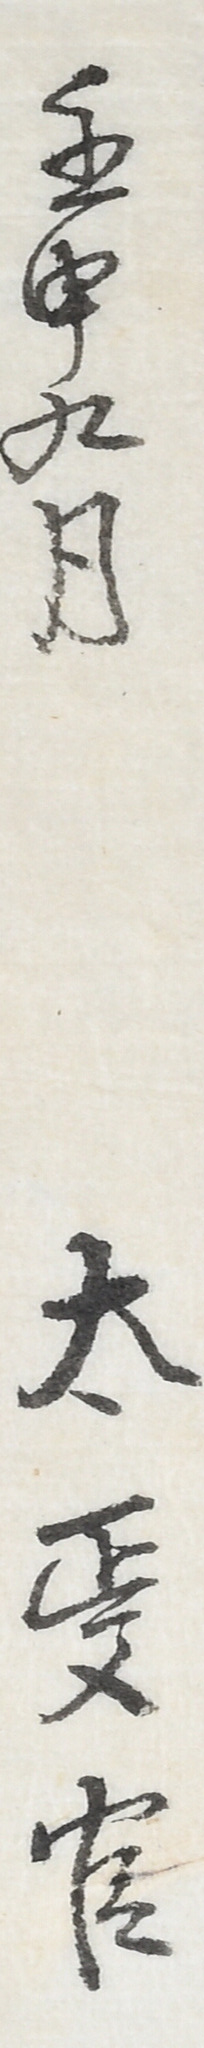壬申九月太政官

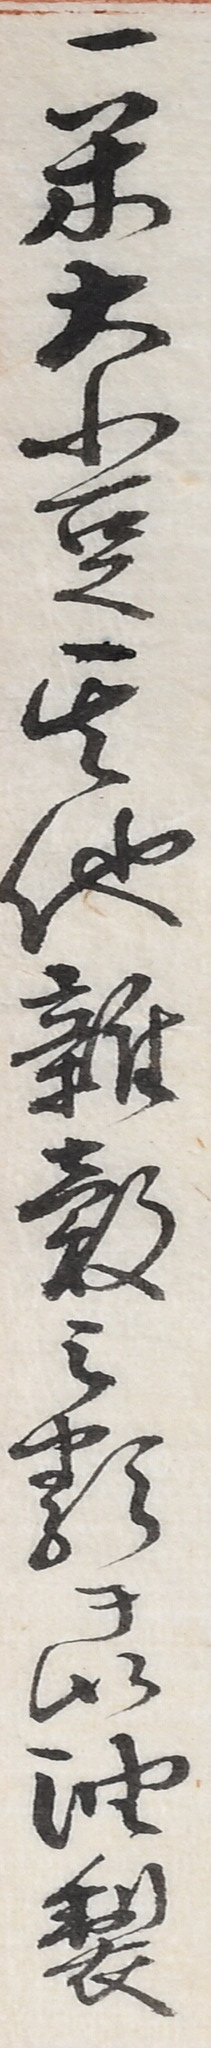一米大小豆其他雑穀之類ヲ以油製
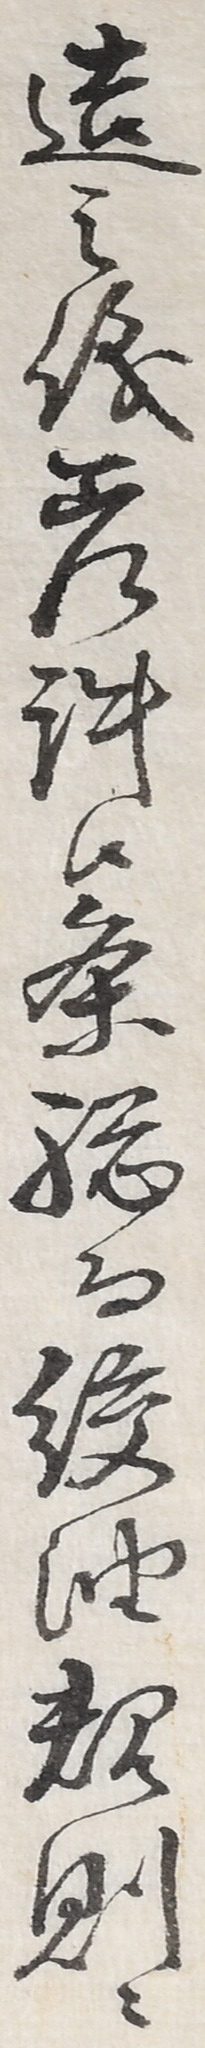造之儀差許候条総而絞油規則ニ
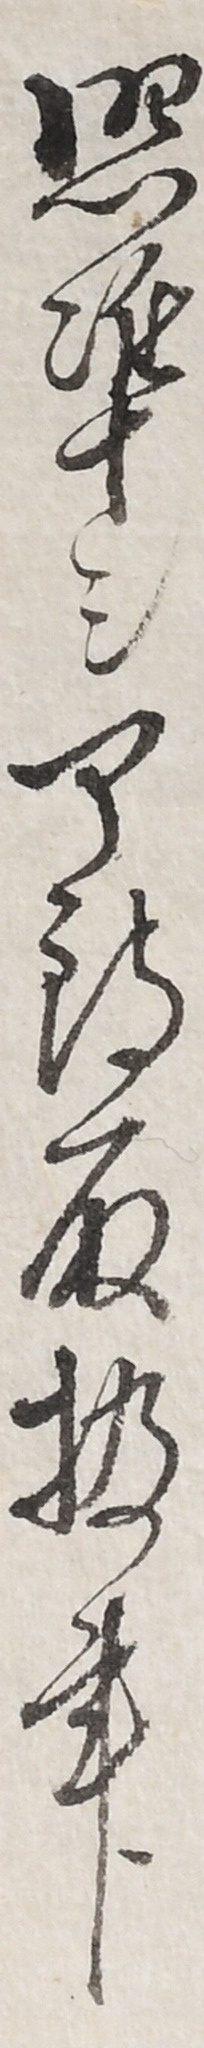照準シ可致取扱事
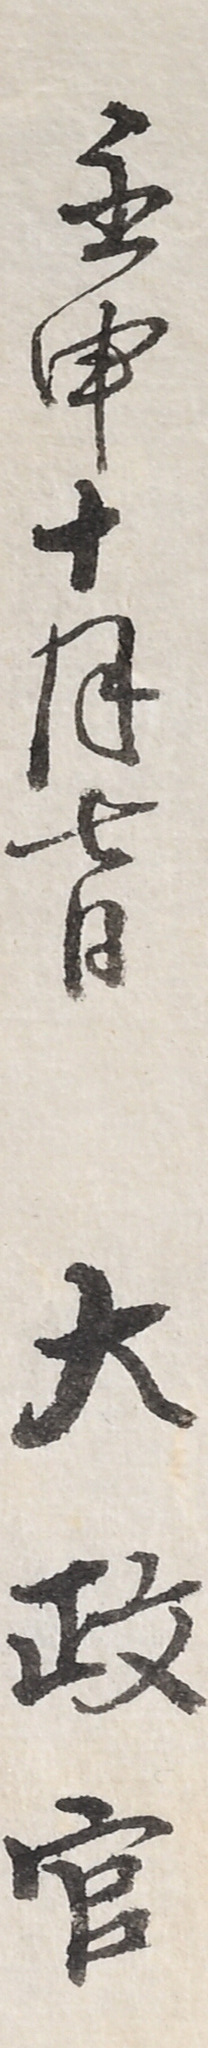壬申十月七日大政官
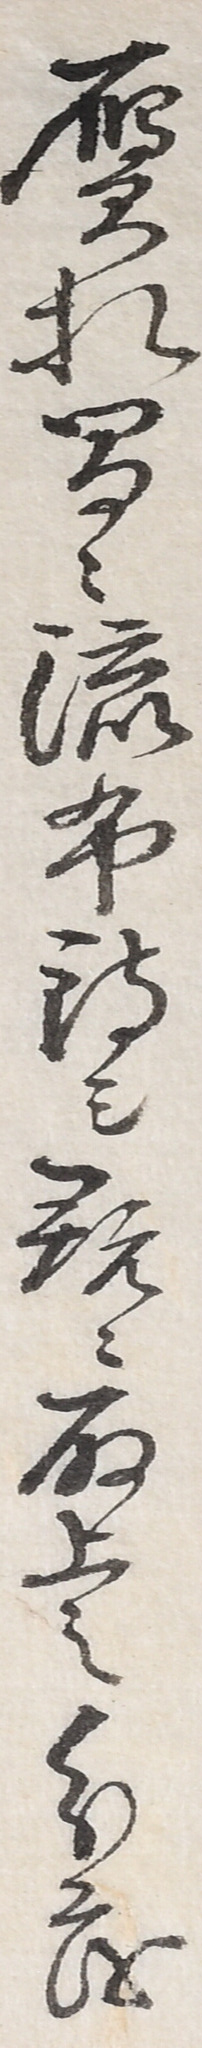贗札間々流布致シ既ニ取上之分も
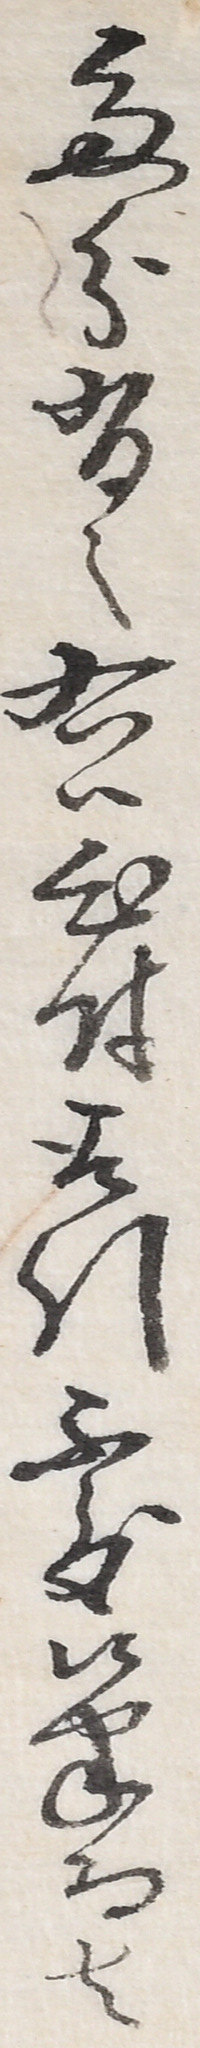多分有之右ハ心付取引不及候は而は
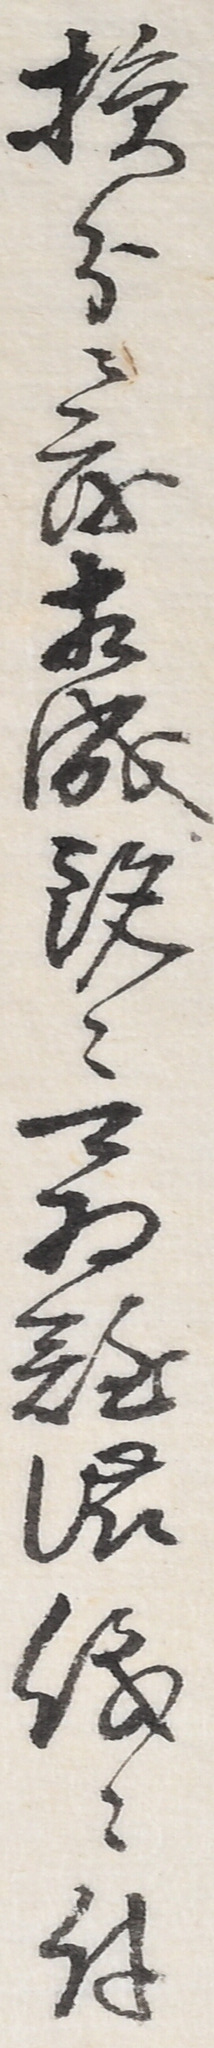損分ニも相成銘々可為難渋儀ニ付
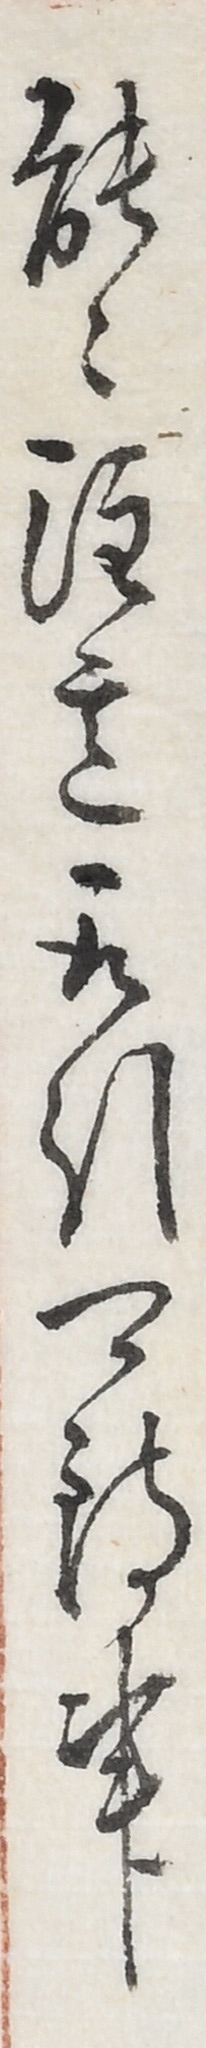能々注意取引可致事
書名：壹番・御布告一式
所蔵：伊那市立高遠町図書館・合同会社AMANE
